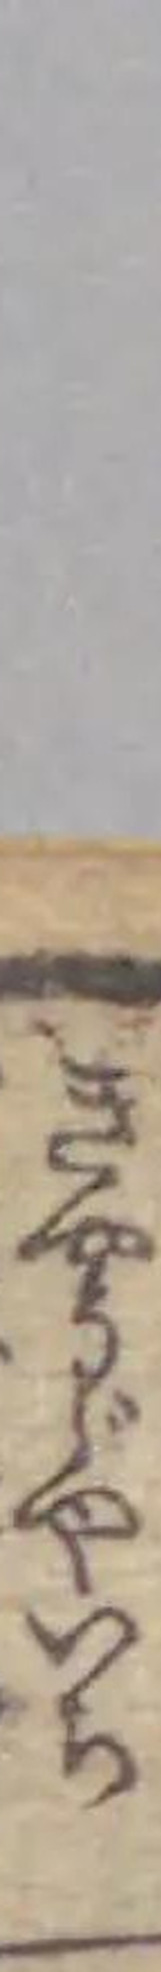きやうじやいち
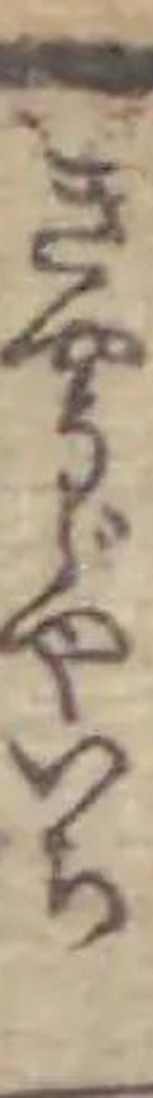きやうじやいち
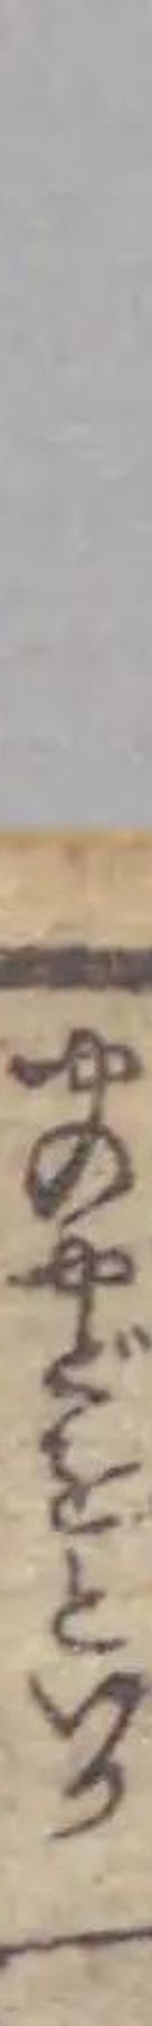やのやどをといか
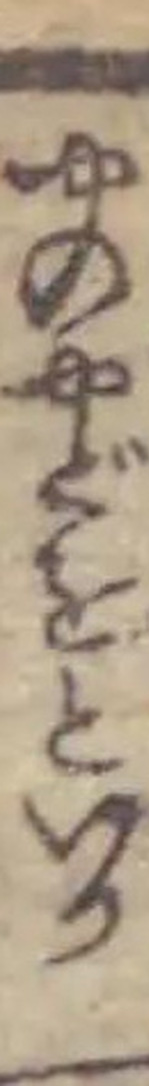やのやどをといか
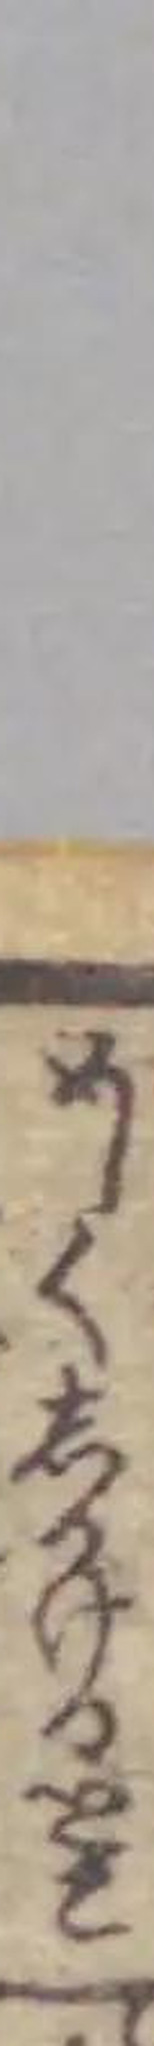めしくしかけるとこ
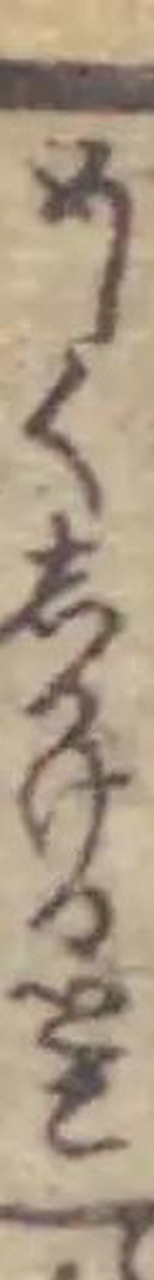めしくしかけるとこ
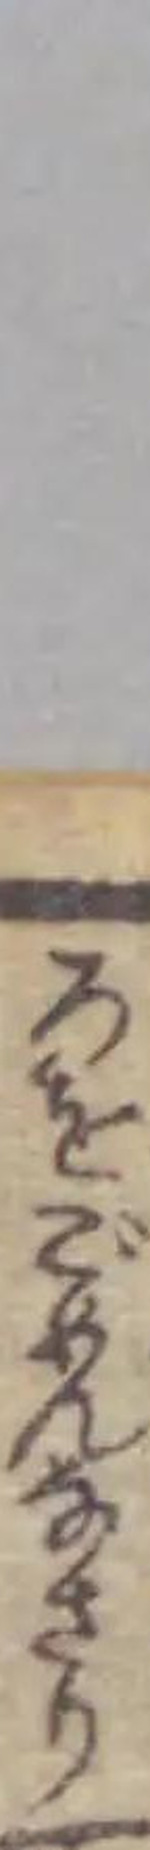ろをごめんなさり
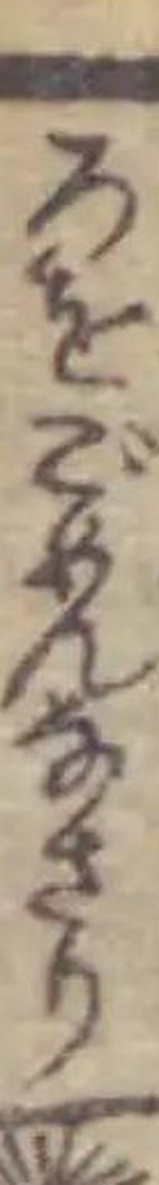ろをごめんなさり
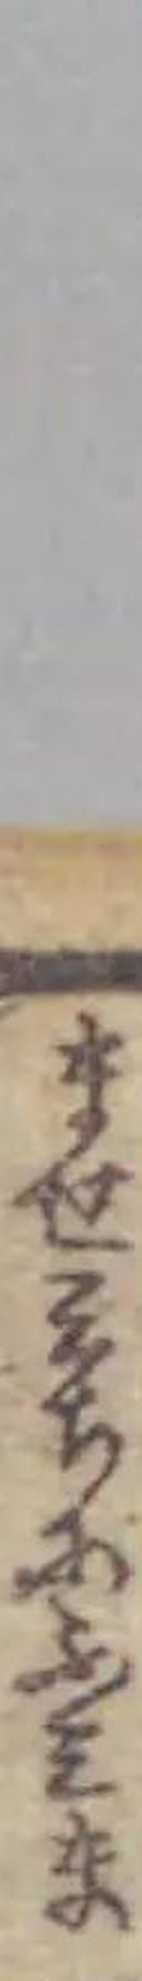ませみちにふみま
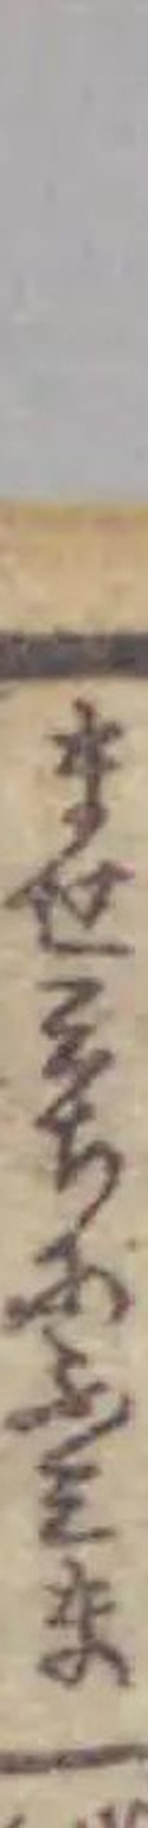ませみちにふみま
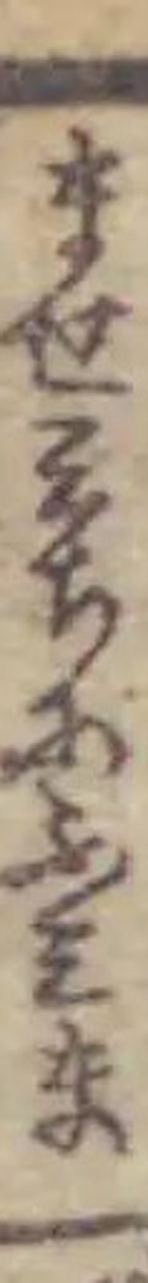ませみちにふみま
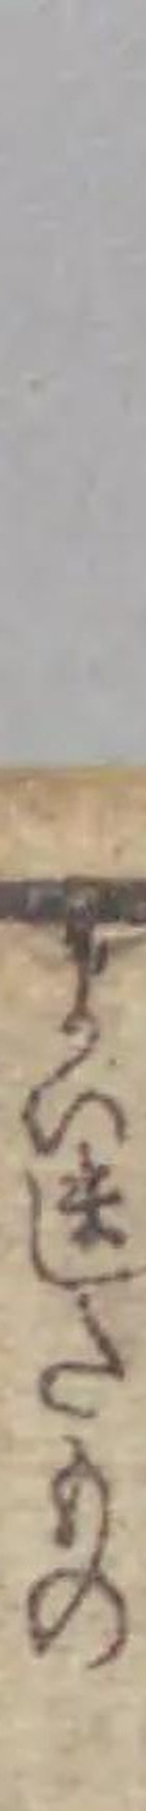よいましたもの
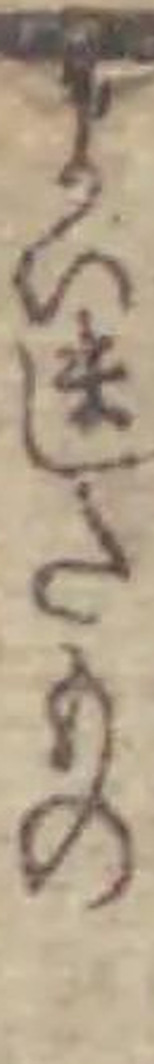よいましたもの
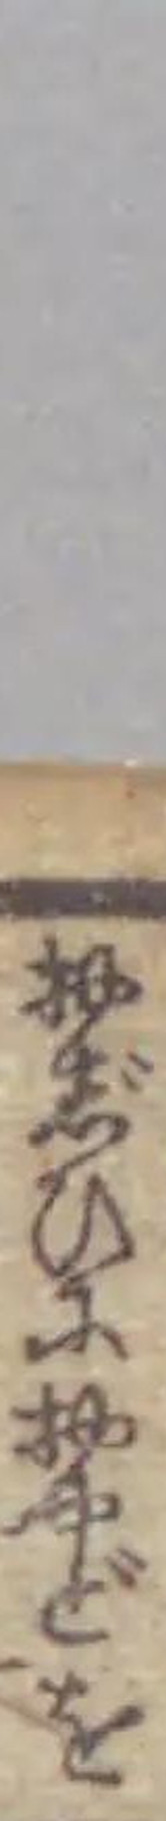おじひにおやどを
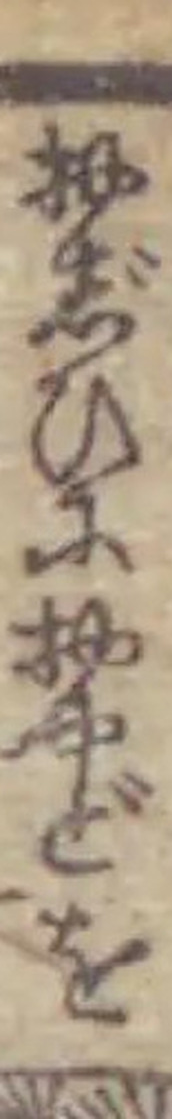おじひにおやどを
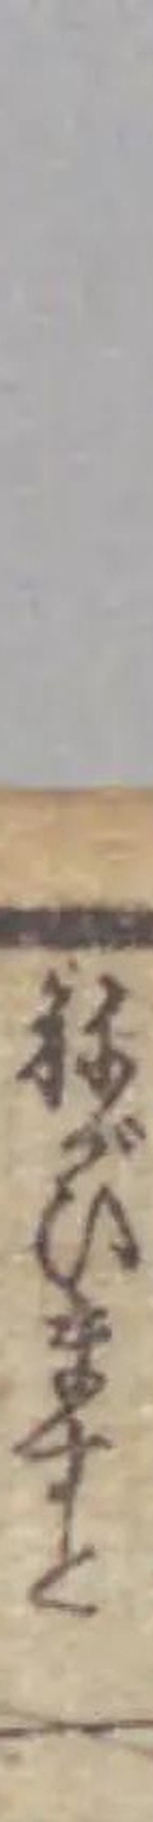ねがひますと
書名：もふもふもふ怖噺 2巻
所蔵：国立国会図書館 National Diet Library, JAPAN
